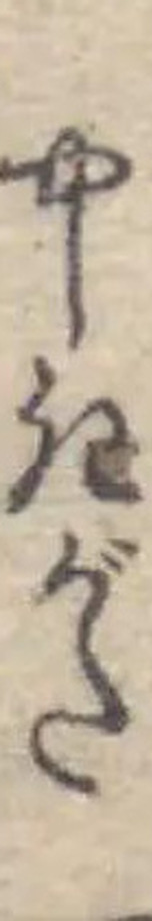やしきがた
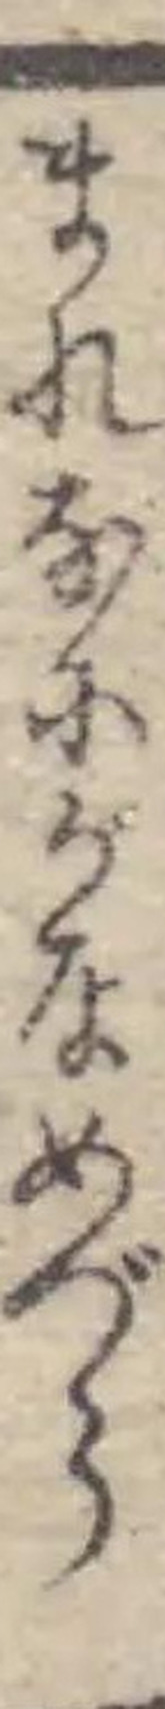まれなにがなめづら
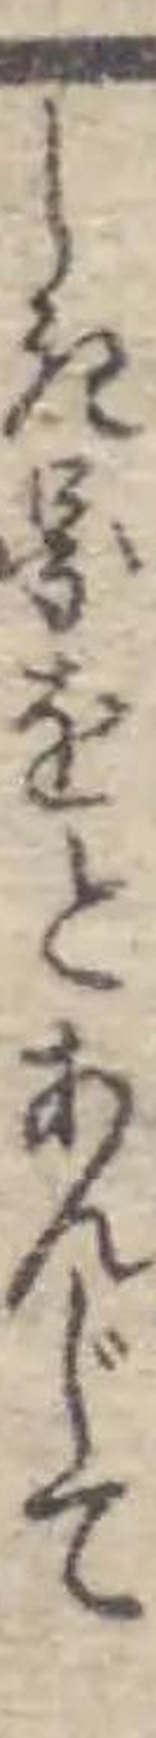しき図をとあんじて
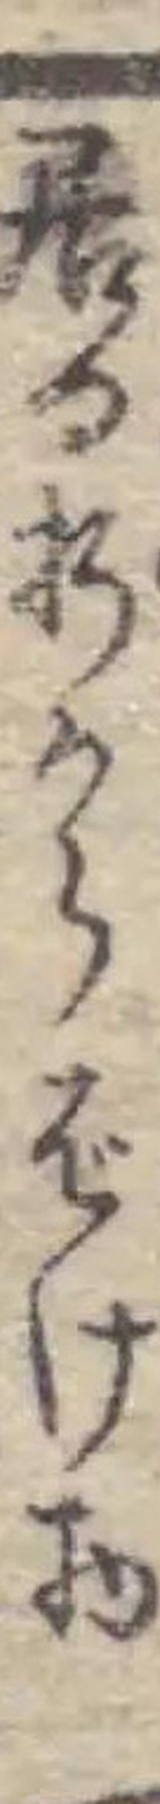居る折からばけ物
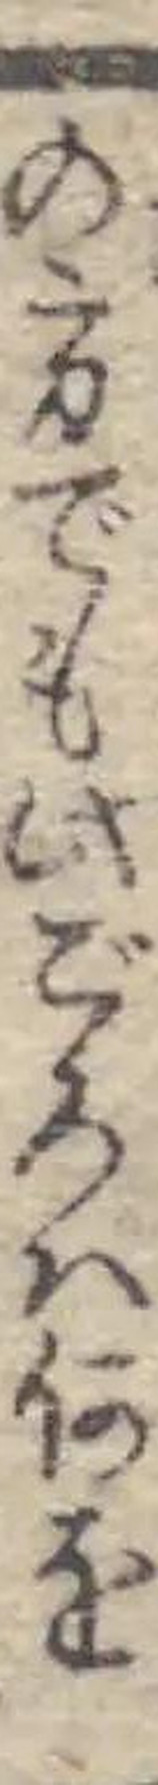の方でも此ごろは何を
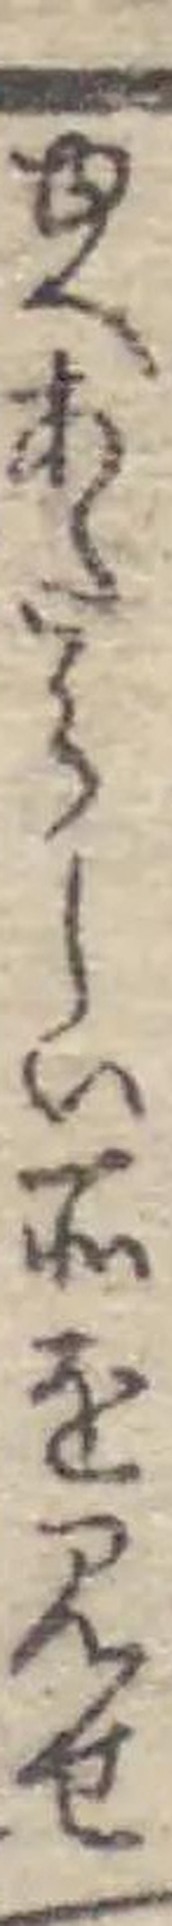ゆへあたらしい所を見せ
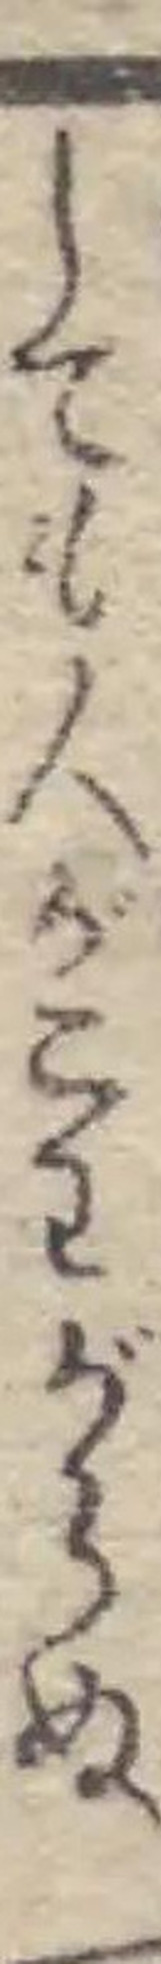しても人がこわがらぬ
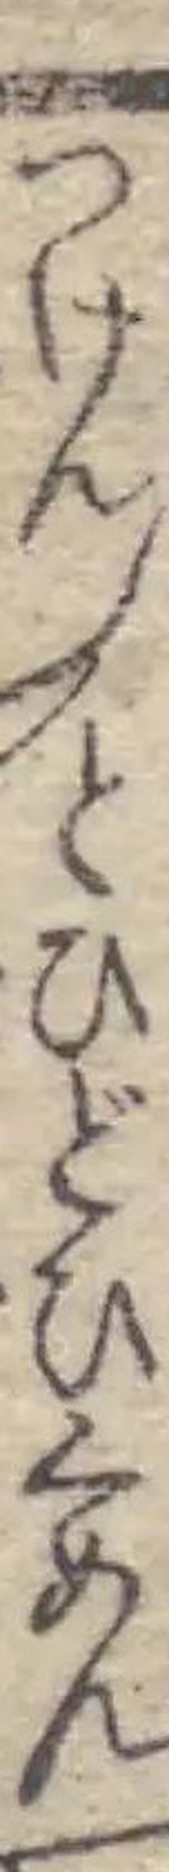つけんとひどひくめん
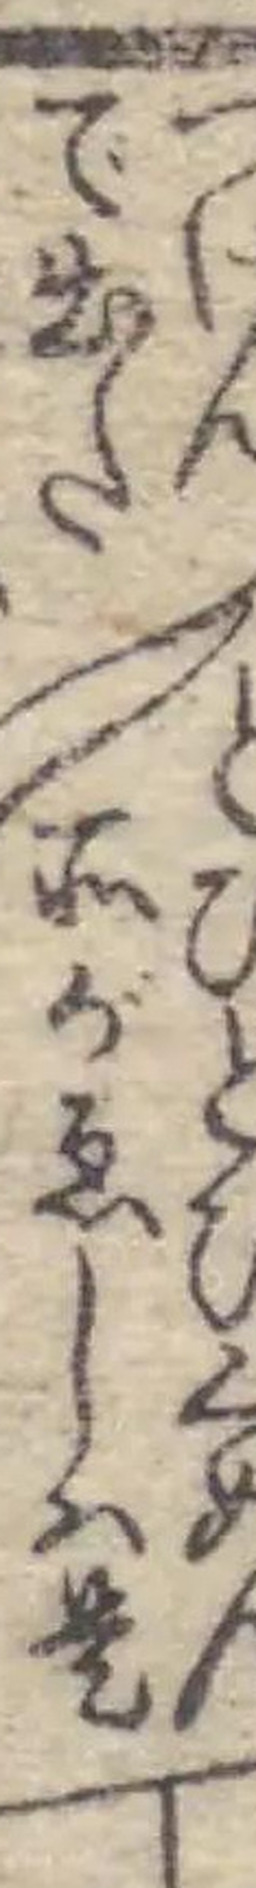で出た所がゑしは是
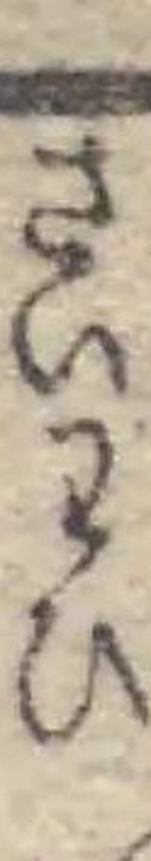さいわひ
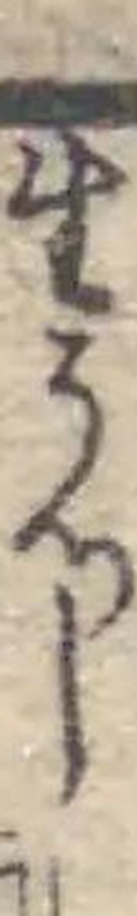生うつし
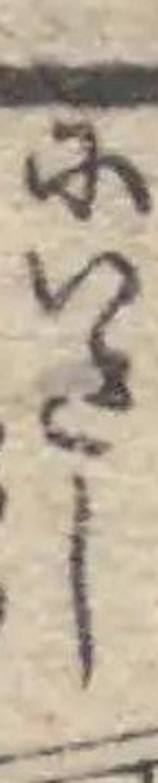にいたし
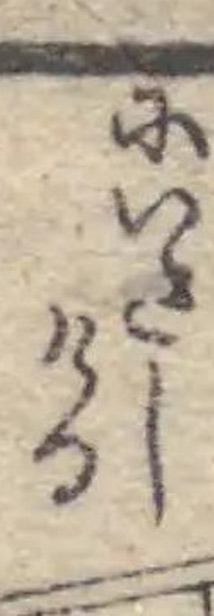にいたし
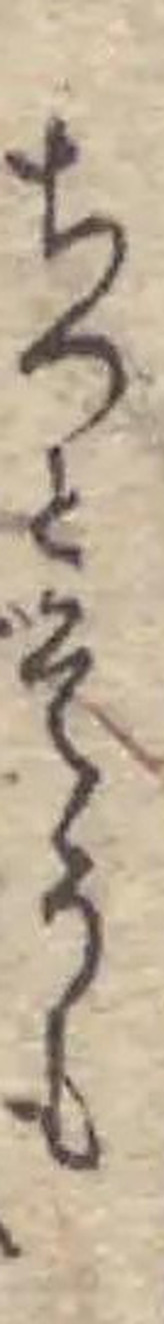ちつとそうも

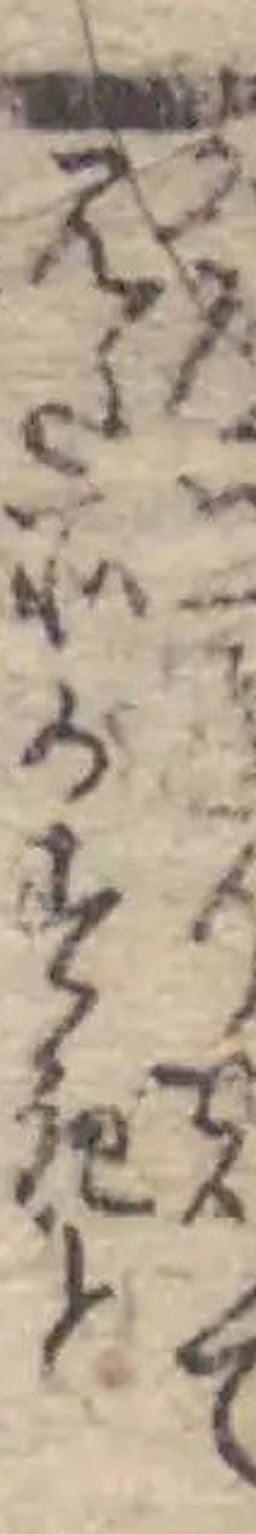みた所がすきと
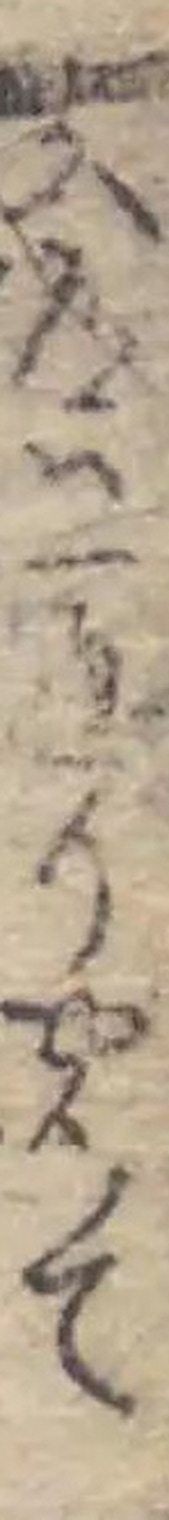入道は一通りやつて
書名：作意妖恐懼感心 2巻
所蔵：国立国会図書館 National Diet Library, JAPAN
